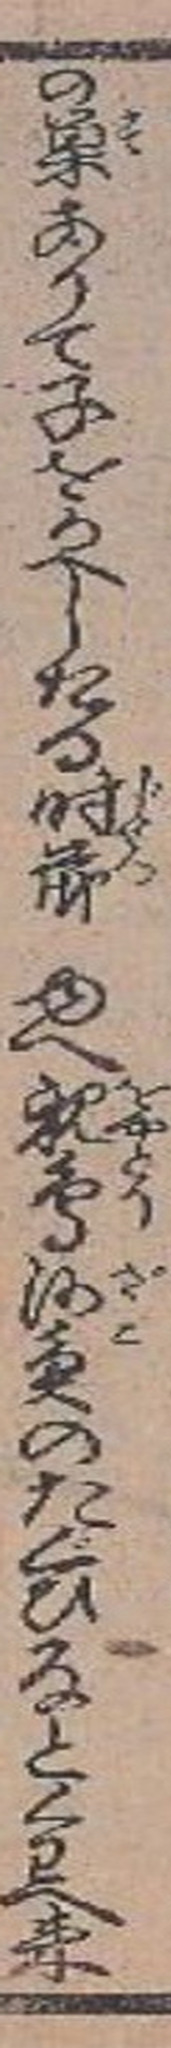の巣ありて子をかへしたる時節ゆへ親鳥雑魚？のたぐひなとくわへ来
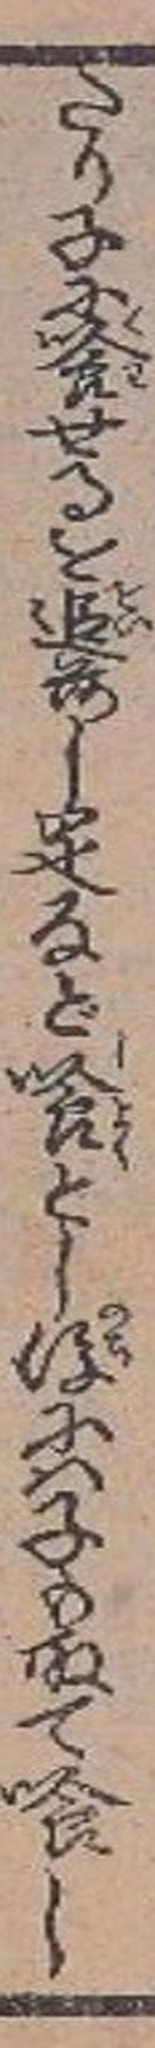たり子に喰せるを追落？し是？など喰とし後には子も取て喰し
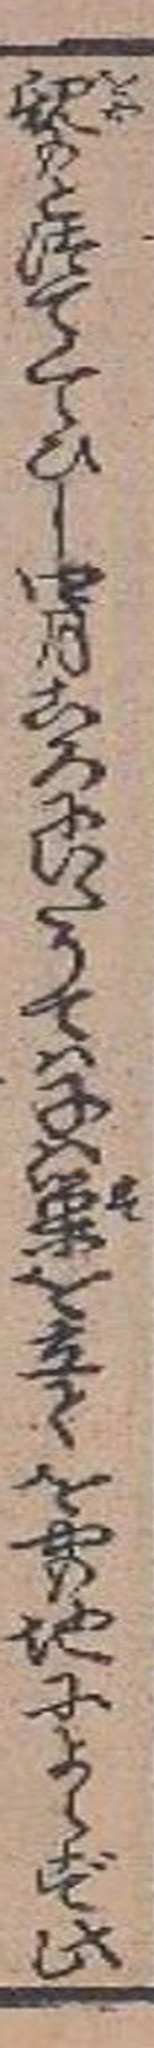親もとつてくらひし四月ころにいたりては子は巣を立ておやも地に子よらず此
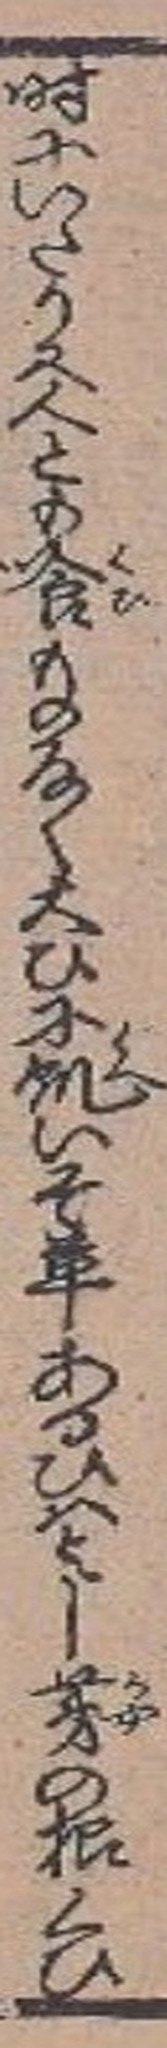時にいたり五人とも喰ものなく大ひに飢いそ草あるひはよし茅の根くひ
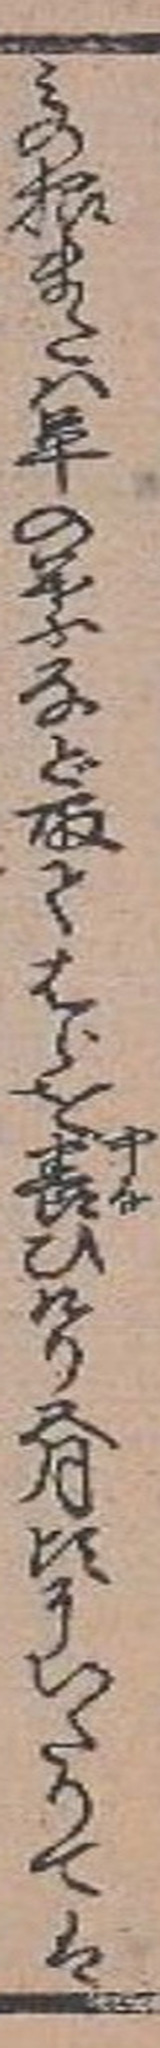みの根または草の葉など取てはらを養ひけり五月頃にいたりては
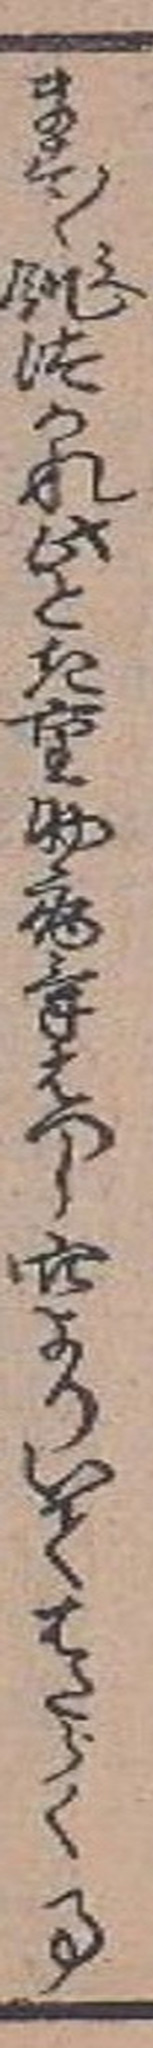ます〳〵飢つかれ此とき重助病気はつし穴よりいてはたらく事
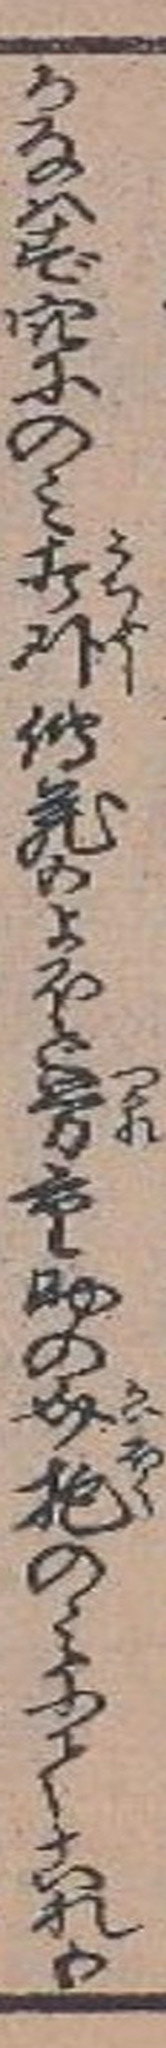かなはず穴にのみ打臥伝蔵もよほど労重助の介抱のみにてこれも
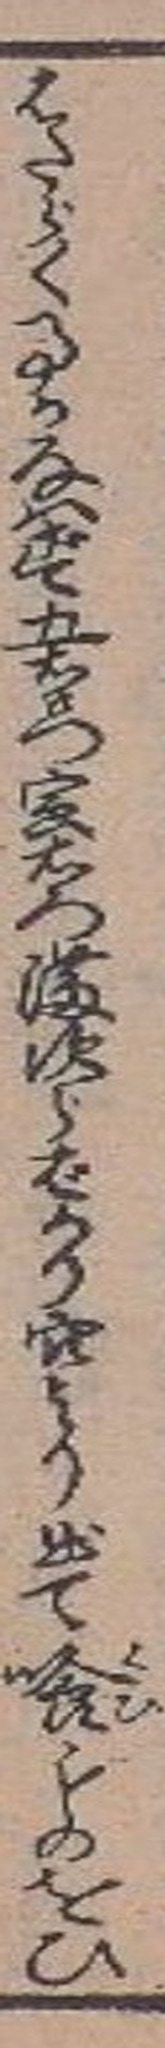はたらく事かなはず五右衛門寅右衛門満次郎ばかり穴より出て喰ものをひ
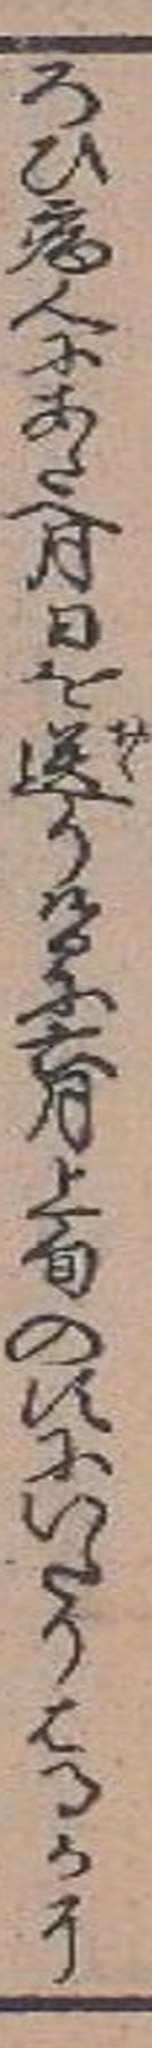ろひ病人にあたへ月日を送りけるに六月上旬の頃にいたりはるかに
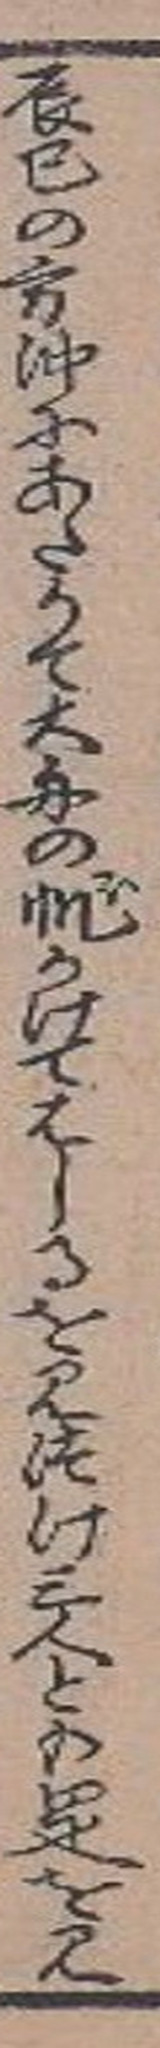辰巳の方沖にあたりて大舟の帆かけてはしるを見つけ三人とも是？を見
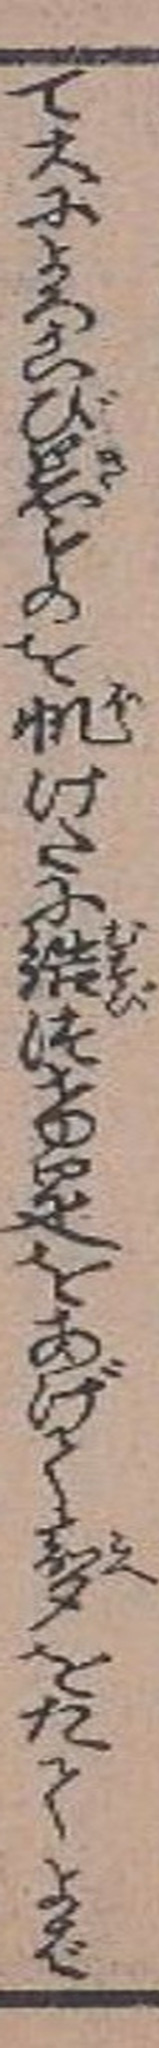て大によろこび着ものを帆けたに結つけ是をあげて声をたてよば
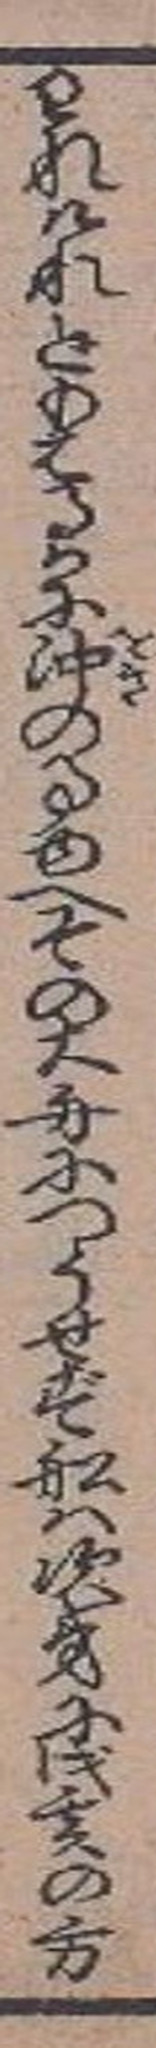われけれどもはるかに沖の事ゆへその大舟につうせず船は次第に戌亥の方
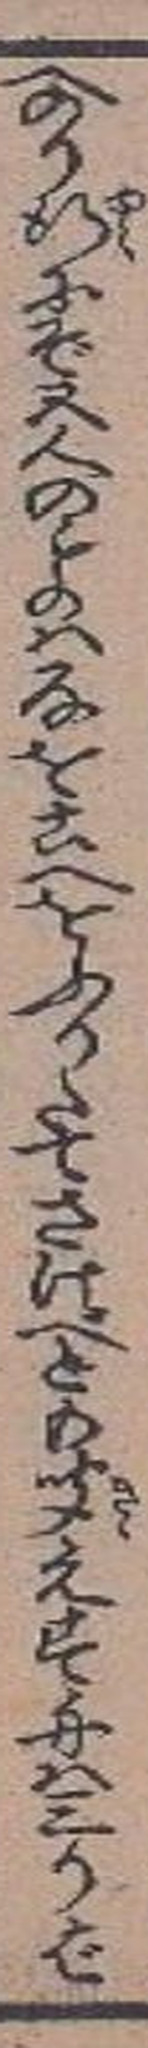へのり行にぞ五人のものはなをこへをふりたてさけべとも聞えす舟は三りば

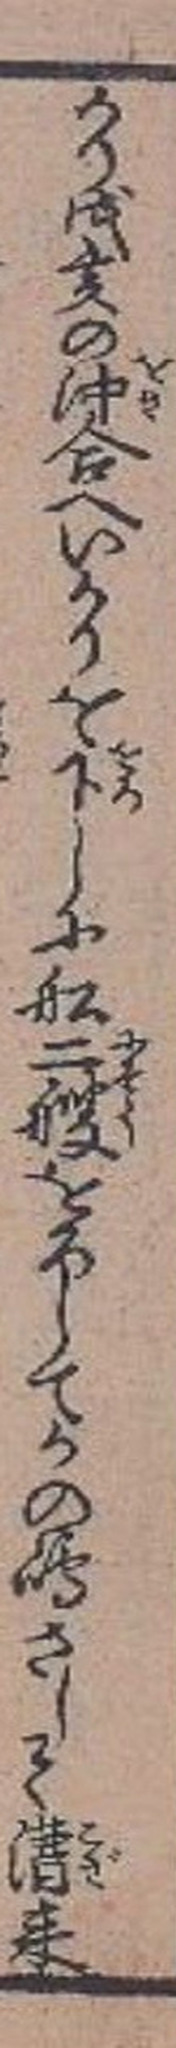かり戌亥の沖合へいかりを下し小船二艘をろしてかの嶋さして漕来
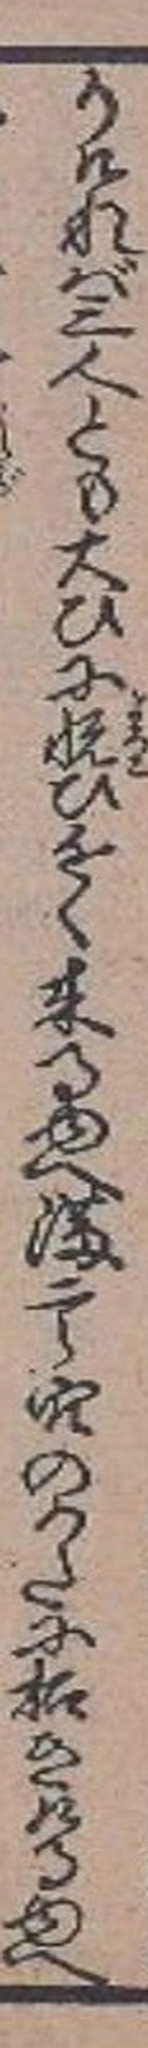りければ三人とも大ひに悦ひ近く来るゆへ満二郎穴のかたに招きけるゆへ
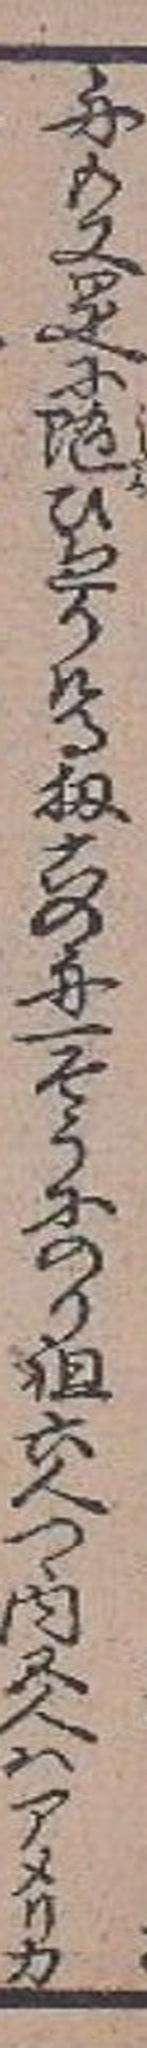舟も又是に随ひ廻りける扨この舟一そうにのり組？六人つゝ内五人はアメリカ
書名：満次郎漂流記
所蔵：University of the Ryukyus Library
